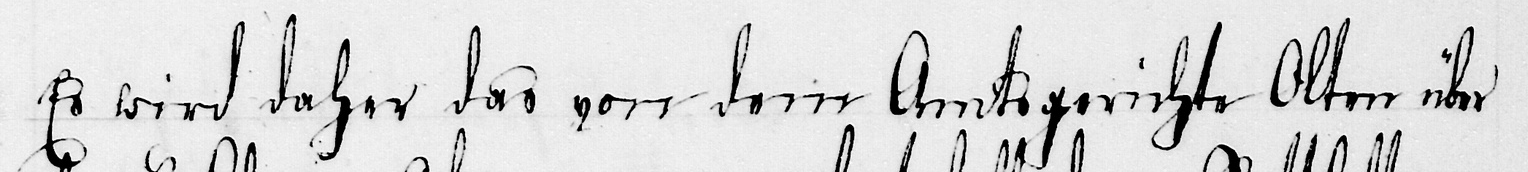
Es wird daher das von dem Amtsgerichte Olten über
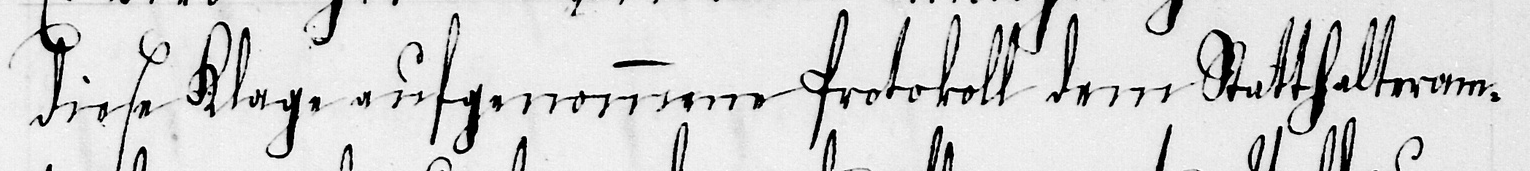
diese Klage aufgenommene Protokoll dem Statthalteram¬
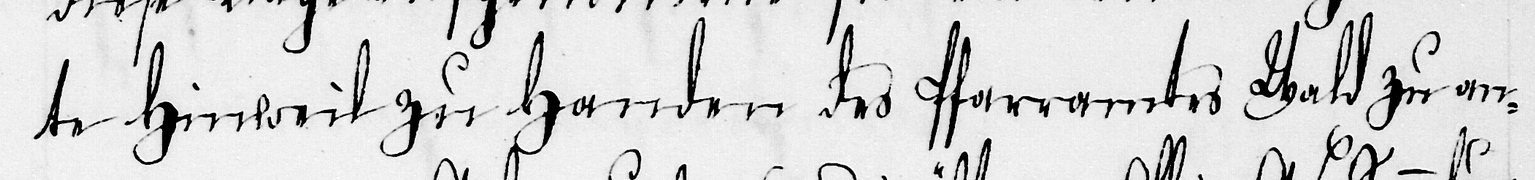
te Hinweil zu Handen des Pfarramtes Wald zu an¬
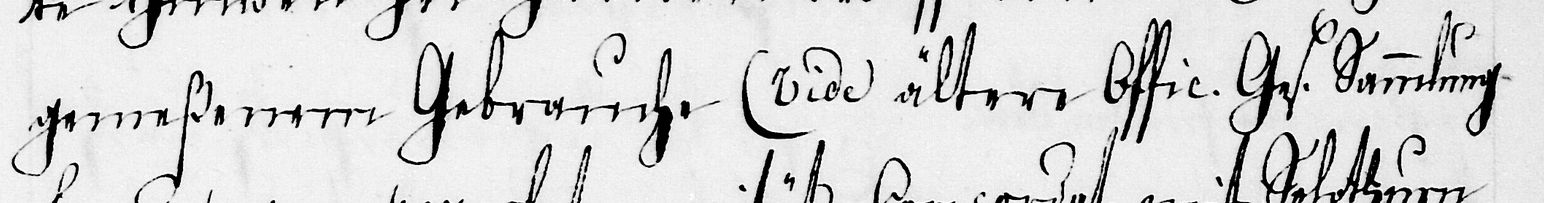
gemeßenem Gebrauche (Vide ältere Offic. Ges. Sammlung
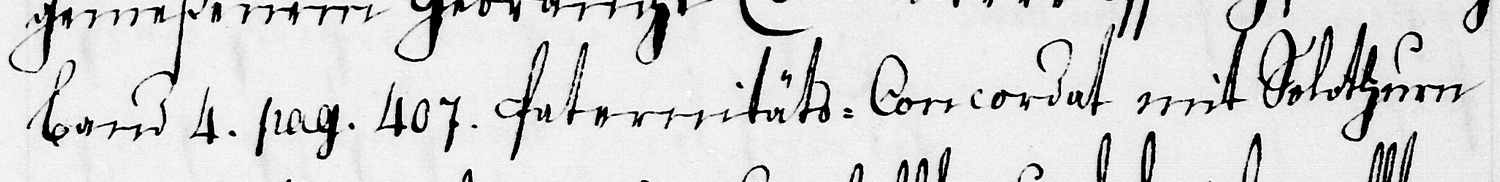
Band 4. pag. 407. Paternitäts-Concordat mit Solothurn
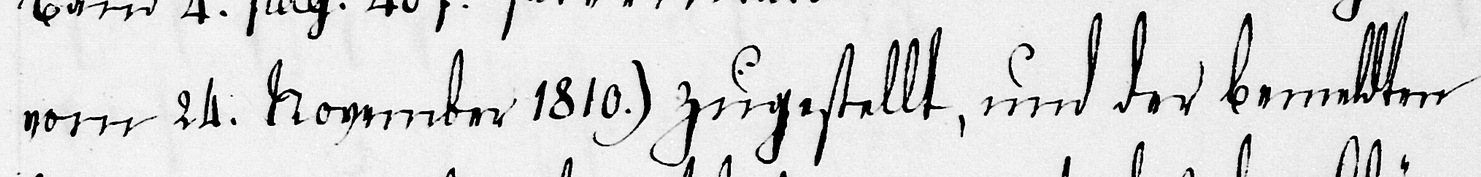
vom 24. November 1810.) zugestellt, und der bemeldten
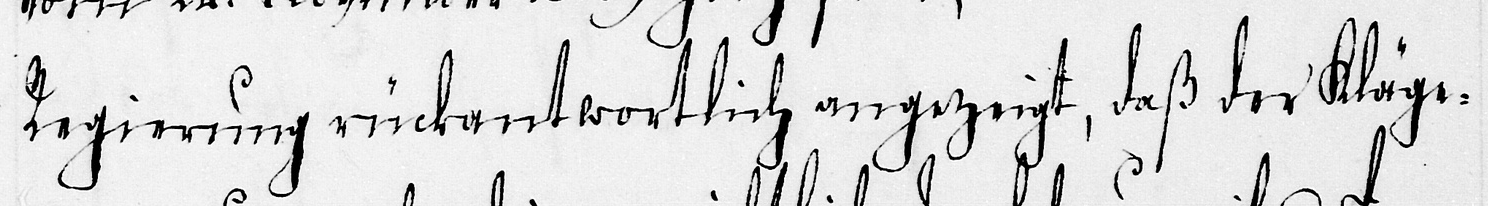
Regierung rückantwortlich angezeigt, daß der Kläge¬
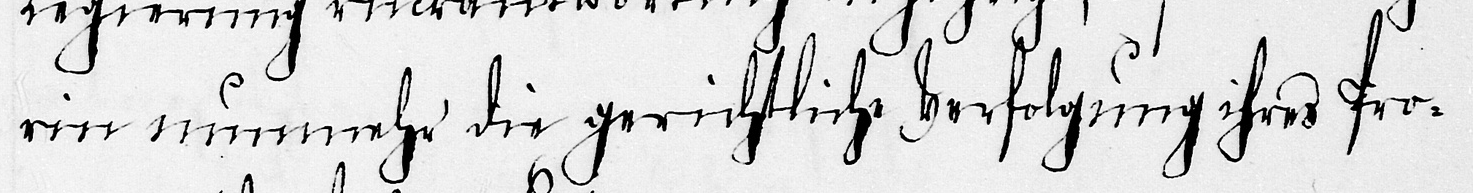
rin nunmehr die gerichtliche Verfolgung ihres Pro¬
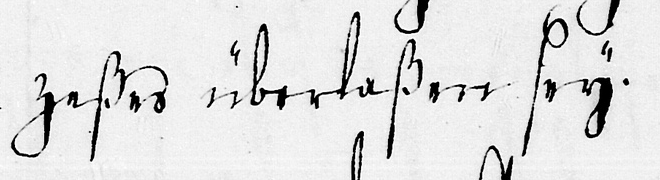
zeßes überlaßen sey.
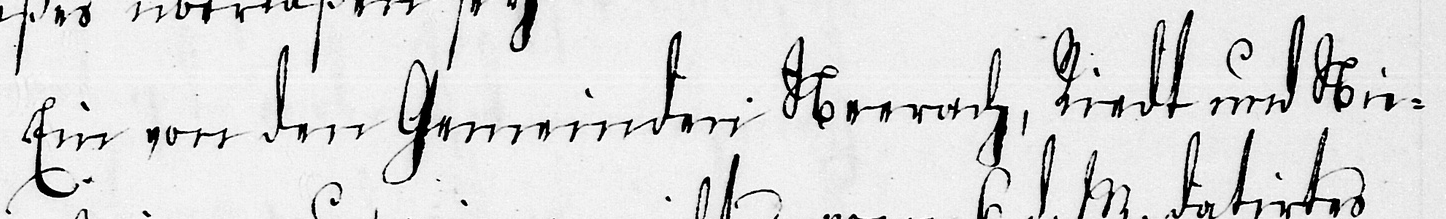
Ein von den Gemeinden Neerach, Riedt und Nie¬
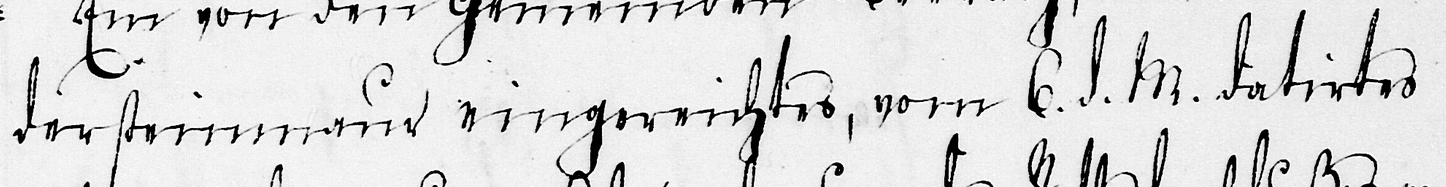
dersteinmaur [sic!] eingereichtes, vom 6. d. M. datirtes
